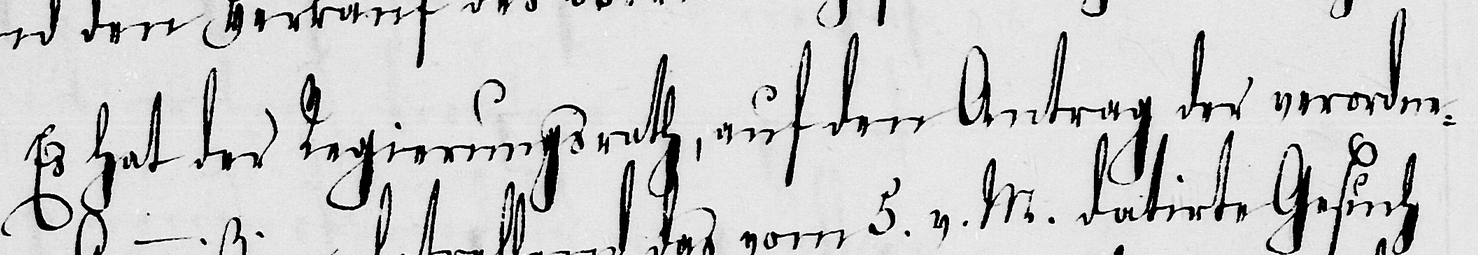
Es hat der Regierungsrath, auf den Antrag der verordn¬
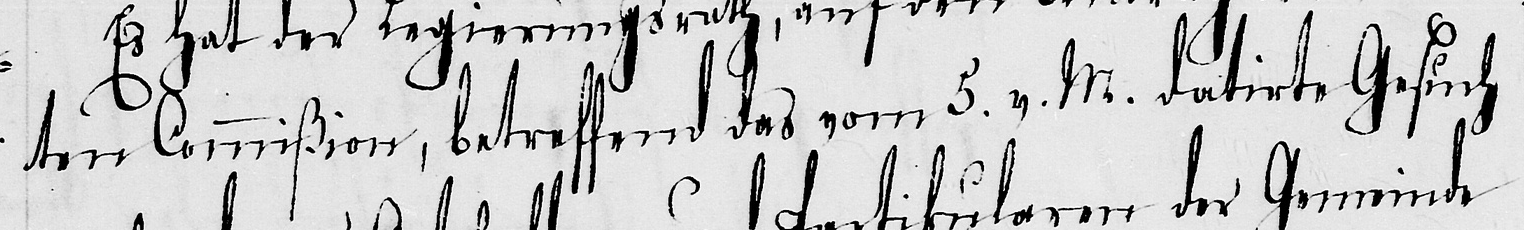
eten Commißion, betreffend das vom 5. v. M. datirte Gesuch
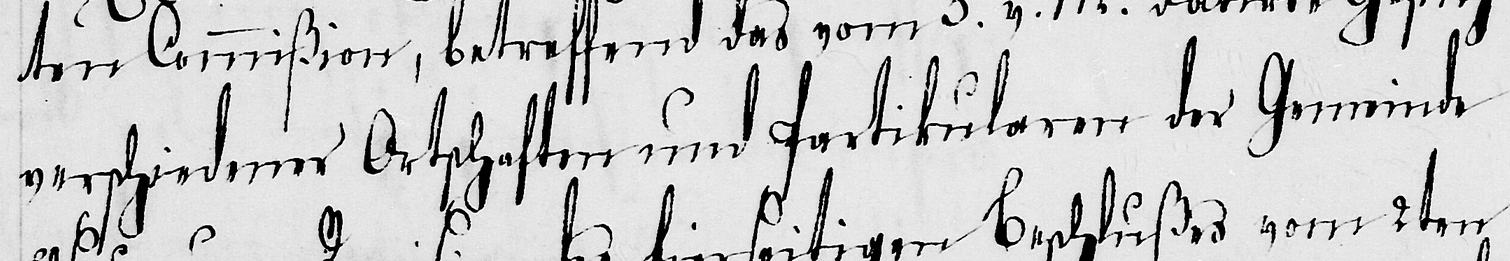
verschiedener Ortschaften und Partikularen der Gemeinde
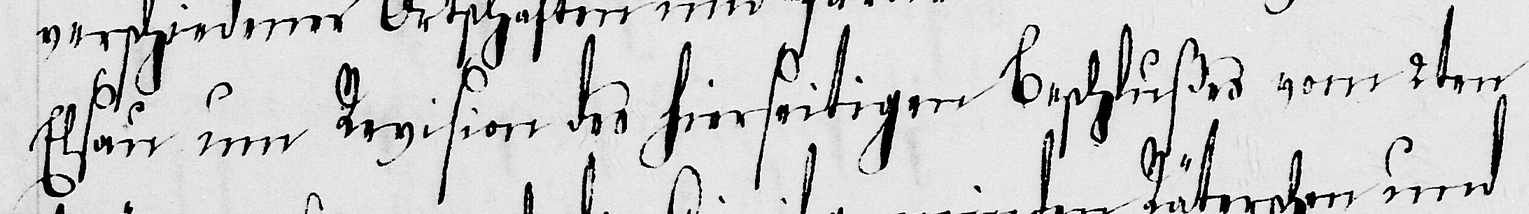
Elsau um Revision des hierseitigen Beschlußes vom 2ten
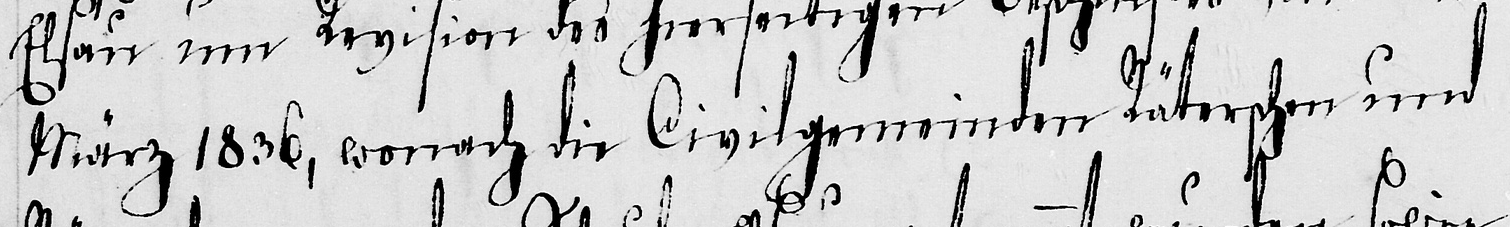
März 1836, wonach die Civilgemeinden Räterschen und
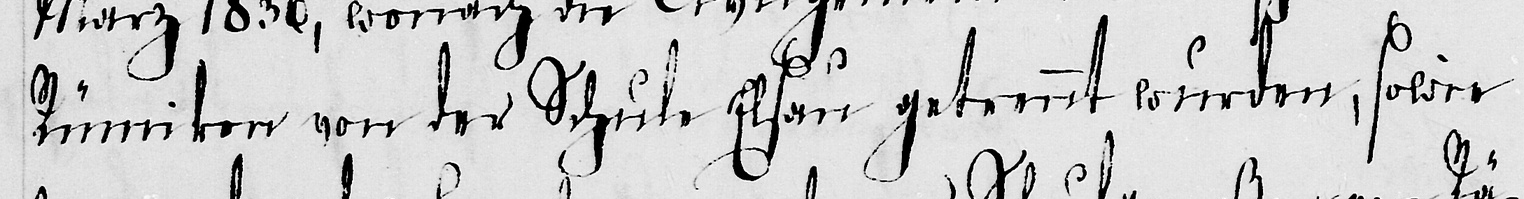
Rümikon von der Schule Elsau getrennt wurden, sowie
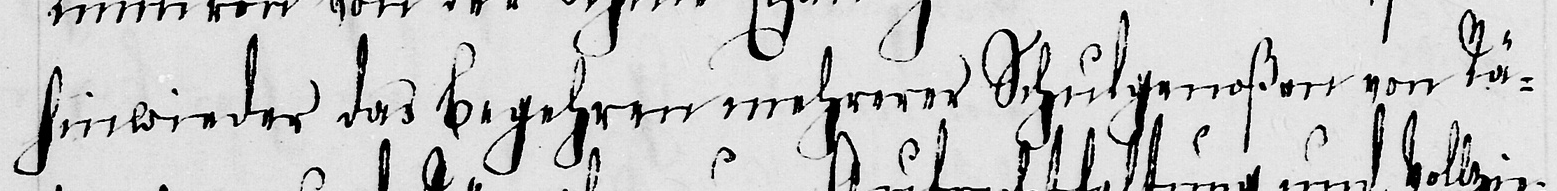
hinwieder das Begehren mehrerer Schulgenoßen von Rä¬
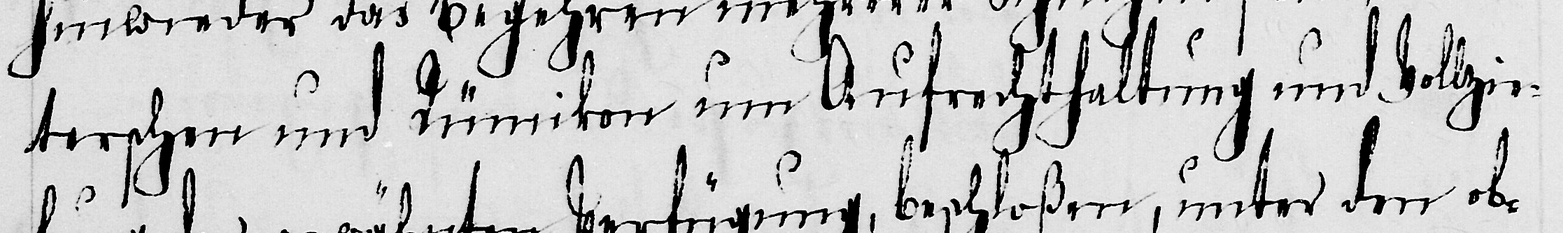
terschen und Rümikon um Aufrechterhaltung und Vollzi¬
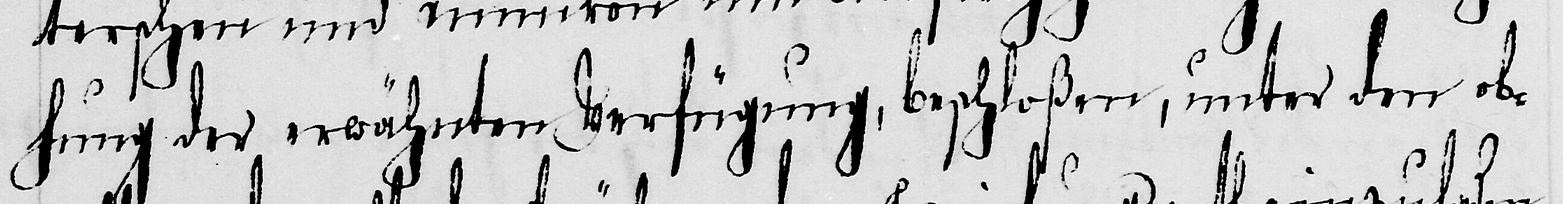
ehung der erwähnten Verfügung, beschloßen, unter den ob¬
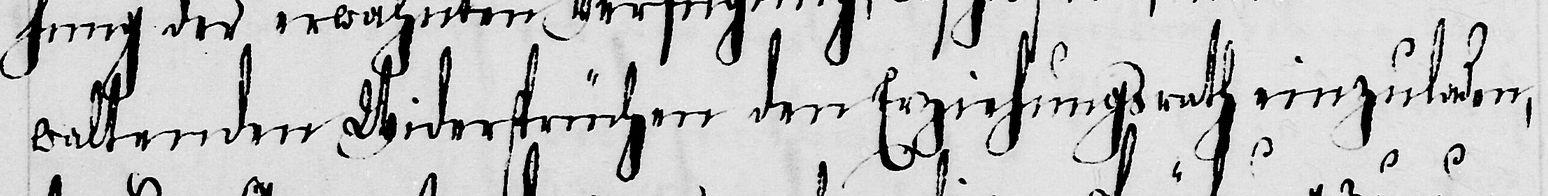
waltenden Widersprüchen den Erziehungsrath einzuladen,
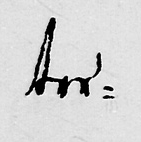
der
